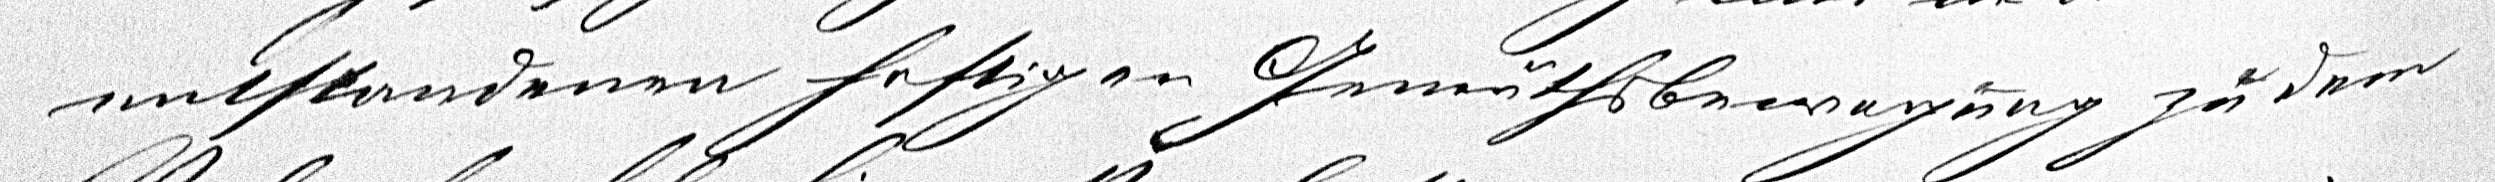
entstandenen heftigen Gemüthsbewegung zu dem
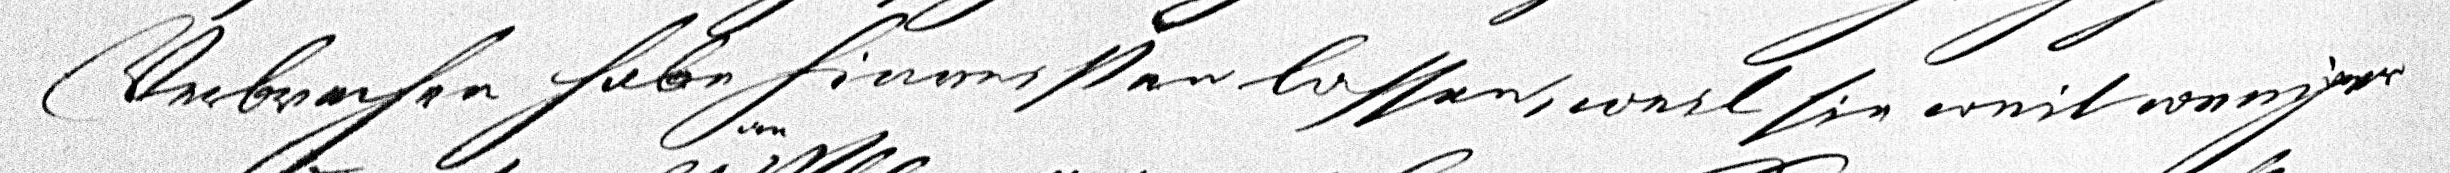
Verbrechen habe hinweißen lassen, weil sie weil weniger
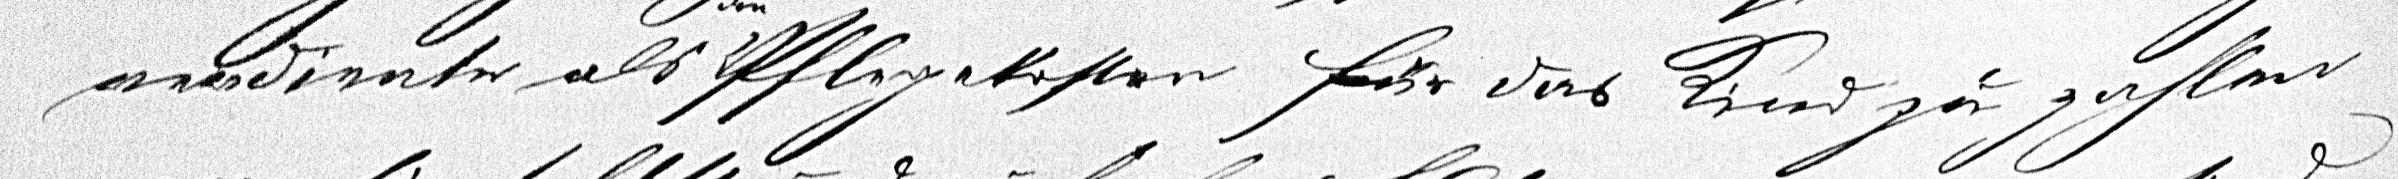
verdiente als an Pflegekosten für das Kind zu zahlen
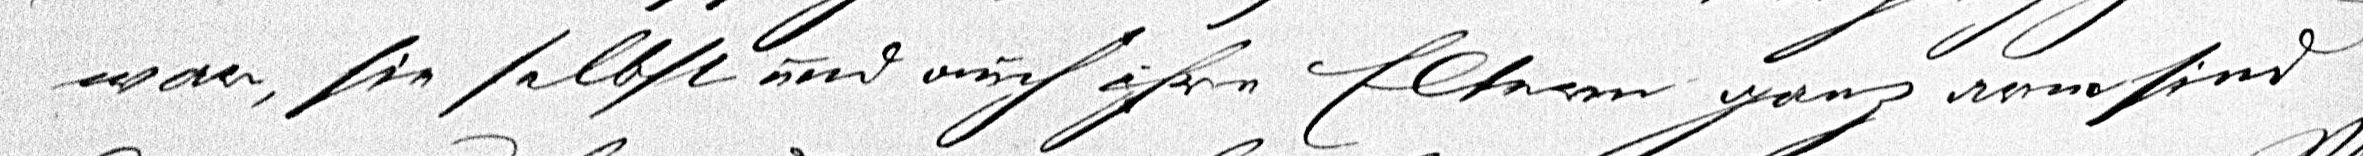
war, sie selbst und auch ihre Eltern ganz xxsind
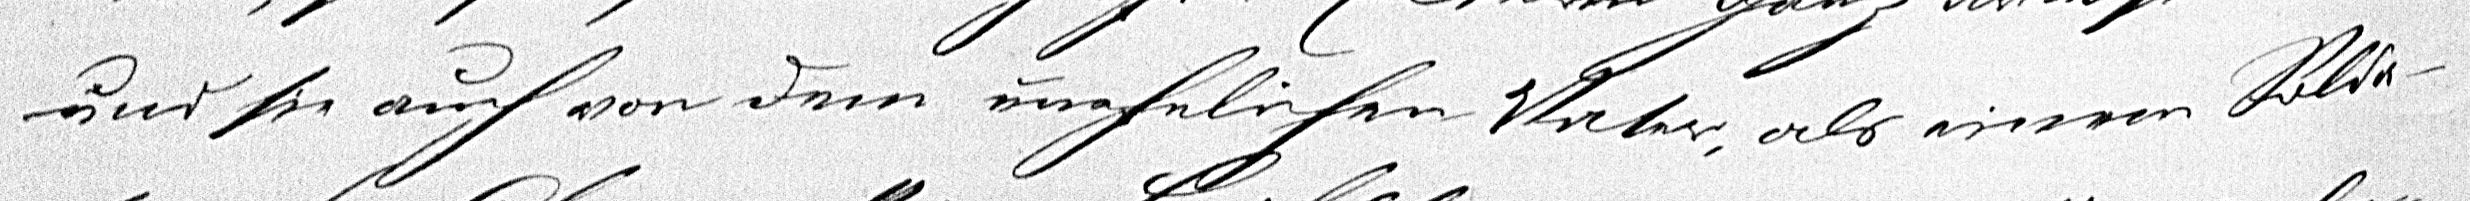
und sie auch von dem unehelichen Vater, als einem Solda¬
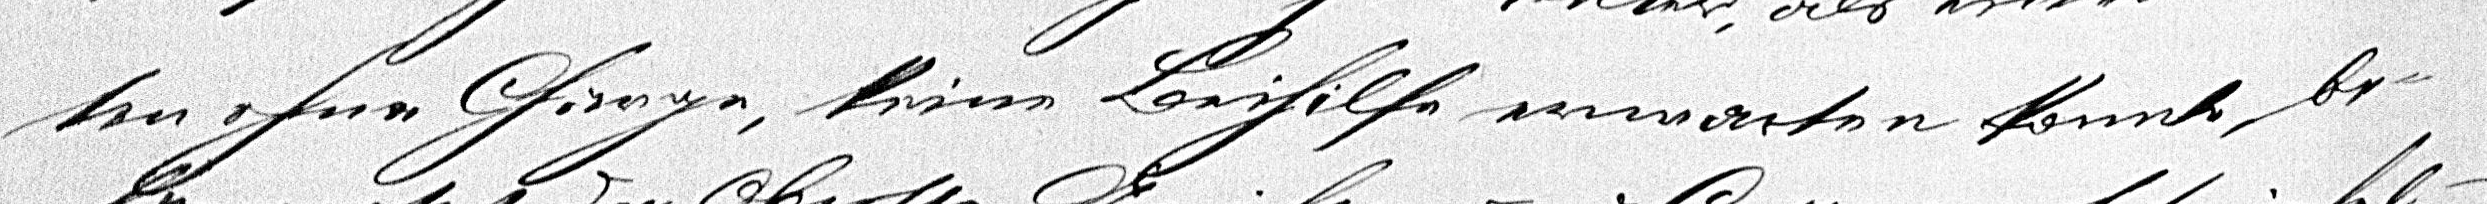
ten ohne Gänge, keine Beihilfe erwarten konnte be¬
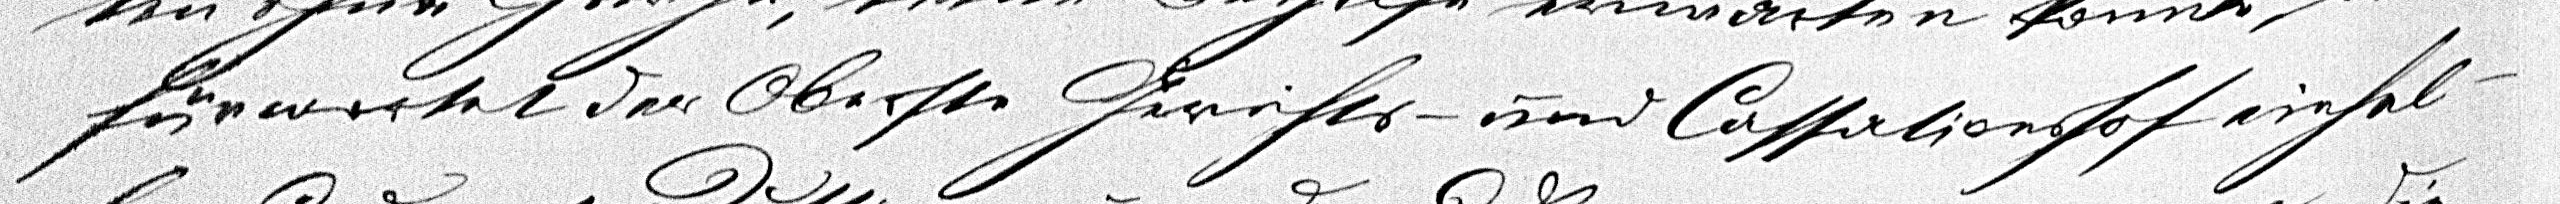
fürwortet der Oberste Gerichts- und Cassationshof einhel¬
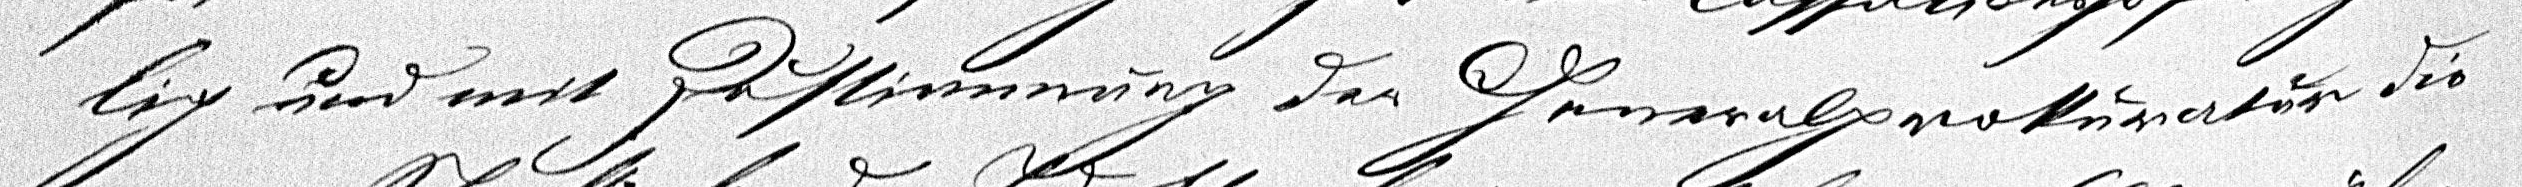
lig und mit Zustimmung der Generalprokuratur die
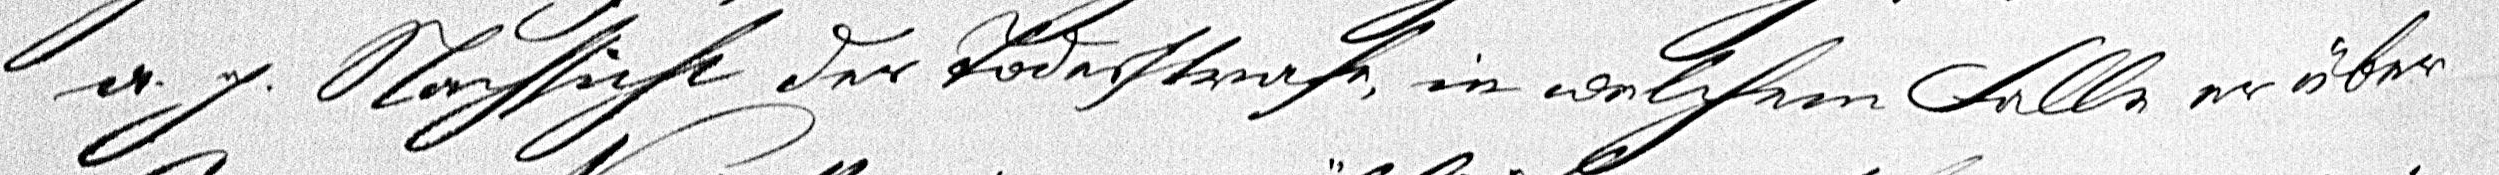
a. g. Nachsicht der Todesstrafe, in welchem Falle er über
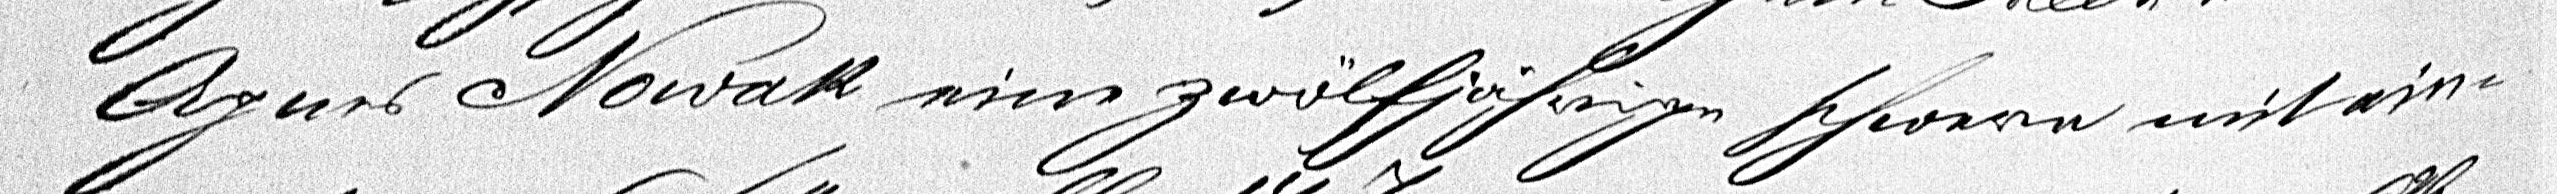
Agnes Nowak eine zwölfjährige schwere mit ein¬
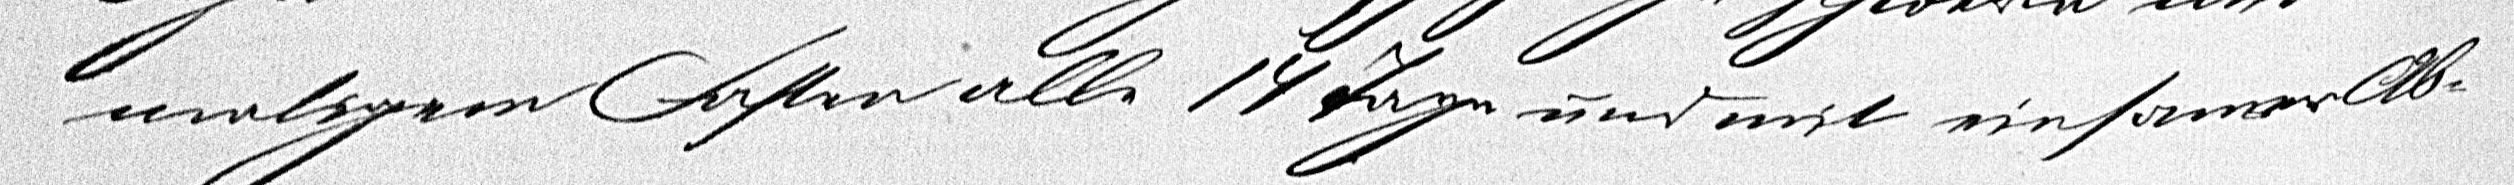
maligem Fasten alle 14 Tage und mit einsamer Ab¬
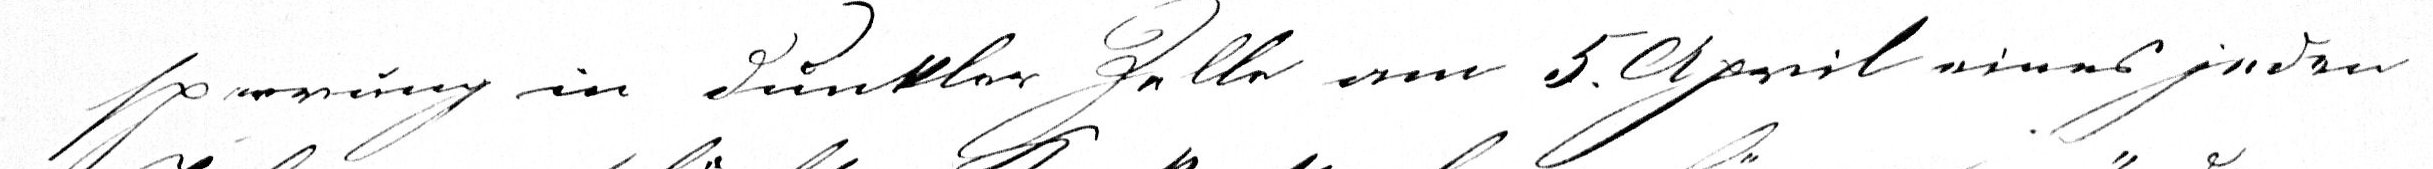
sperrung in dunkler Zelle am 5. April eines jeden
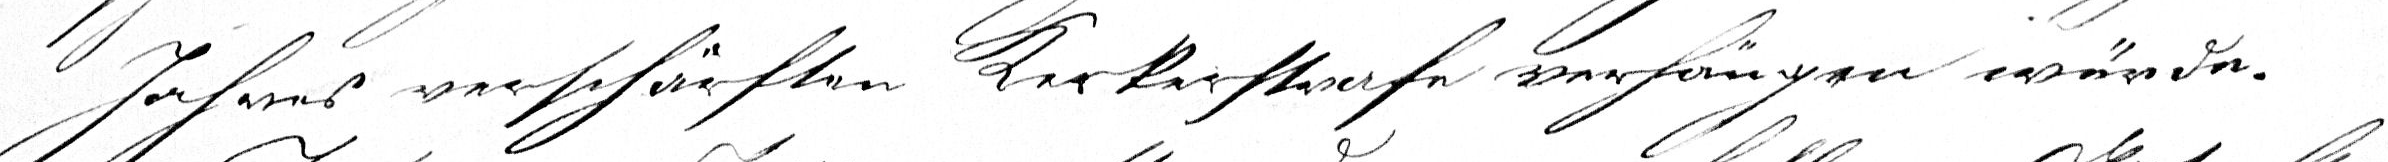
Jahres verschärften Kerkerstrafe verhängen würde.
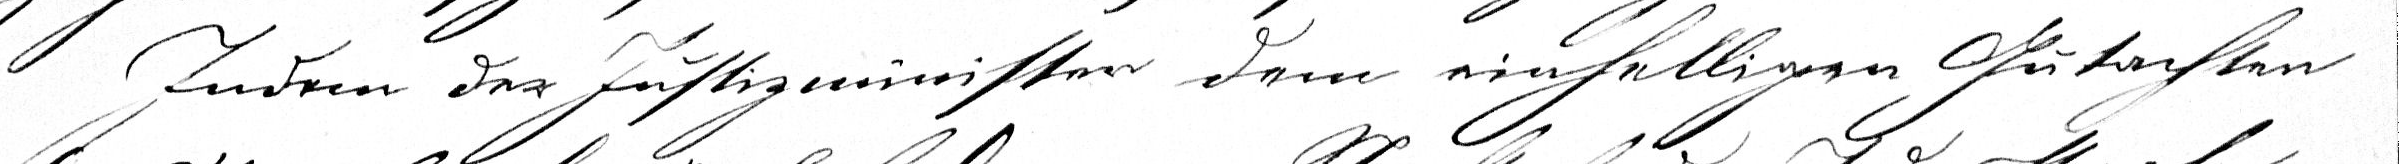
Indem der Justizminister dem einhelligen Gutachten
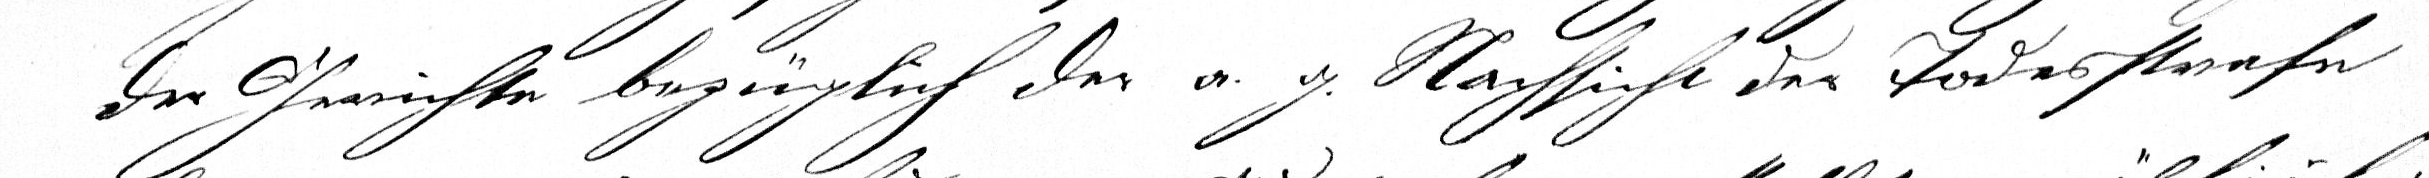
der Gerichte bezüglich der a. g. Nachsicht der Todesstrafe
